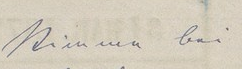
Stimme bei.»
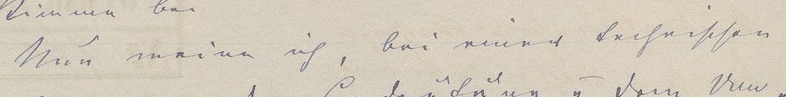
Nun meine ich, bei einer technischen
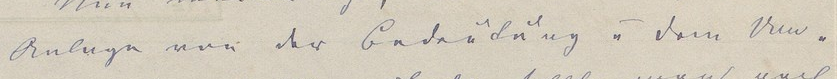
Anlage von der Bedeutung u dem Um-
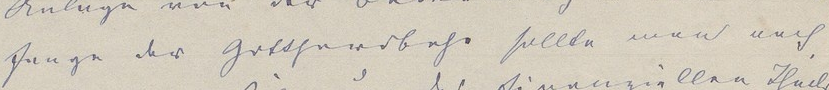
fange der Gotthardbahn sollte man nach
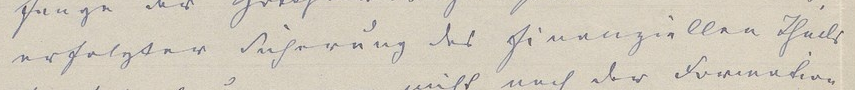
erfolgter Sicherung des finanziellen Theils
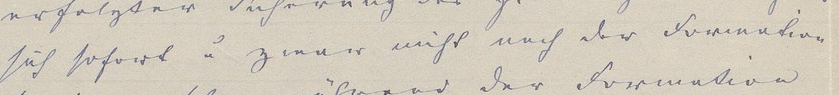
sich sofort u zwar nicht nach der Formation
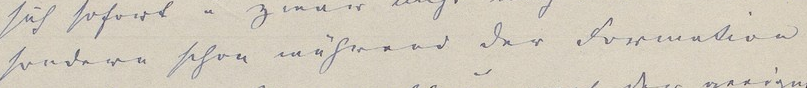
sondern schon während der Formation
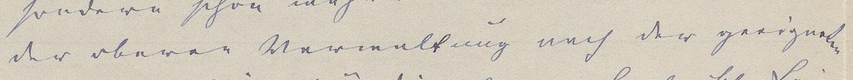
der oberen Verwaltung nach der geeigneten
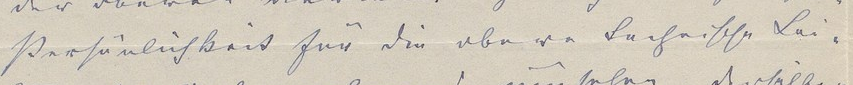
Persönlichkeit für die obere technische Lei-
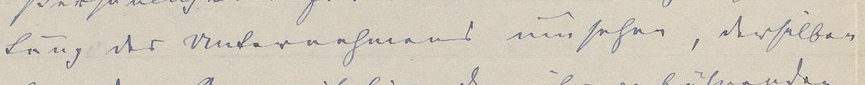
tung des Unternehmens umsehen, derselben
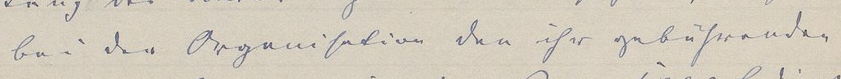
bei der Organisation den ihr gebührenden
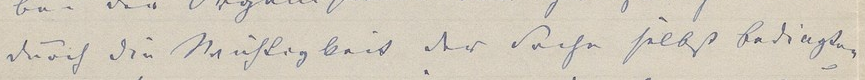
durch die Wichtigkeit der Sache selbst bedingten
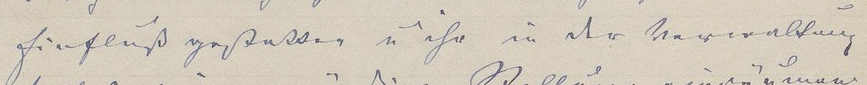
Einfluß gestatten u ihr in der Verwaltung
